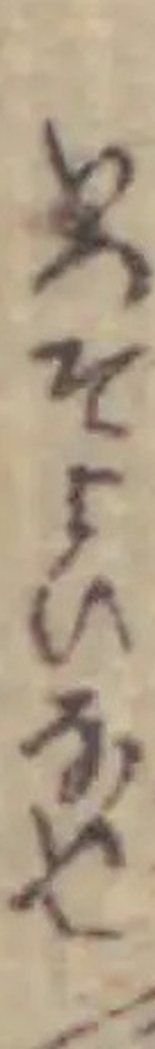いつそよひな
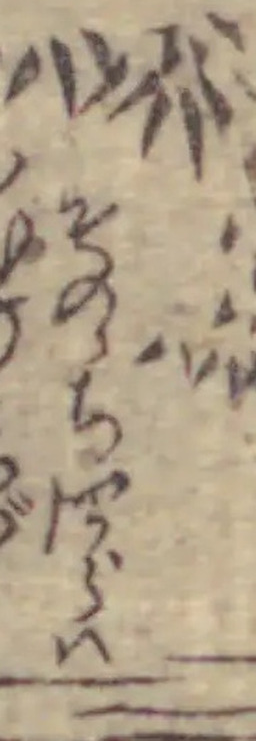そのゝち四郎は
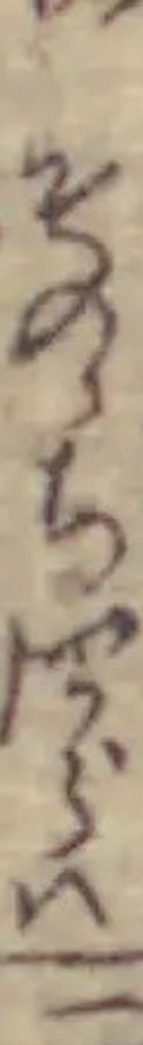そのゝち四郎は
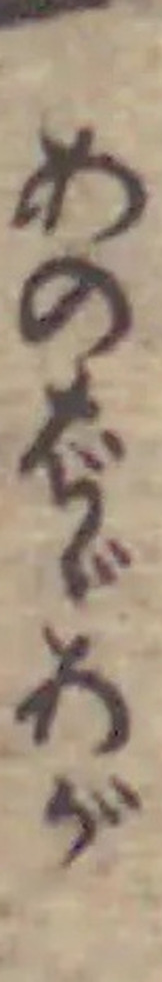あのばゞあが
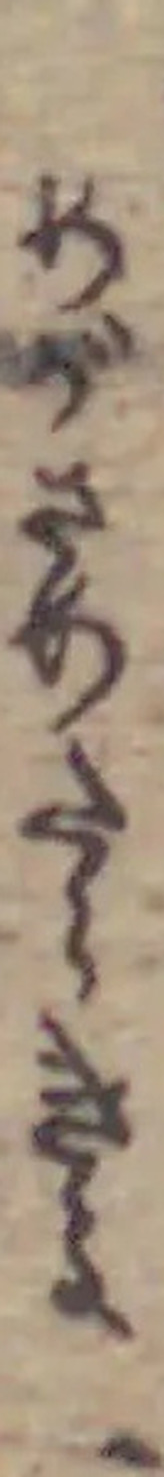めがさめたらきよ
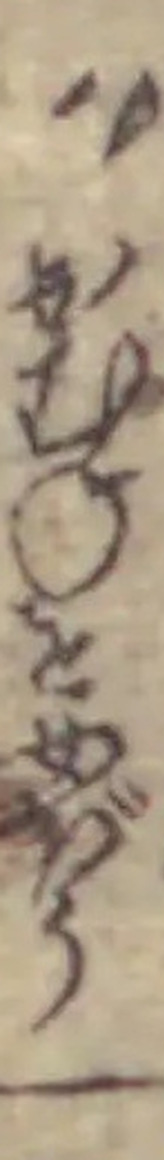おむねを女ぼう
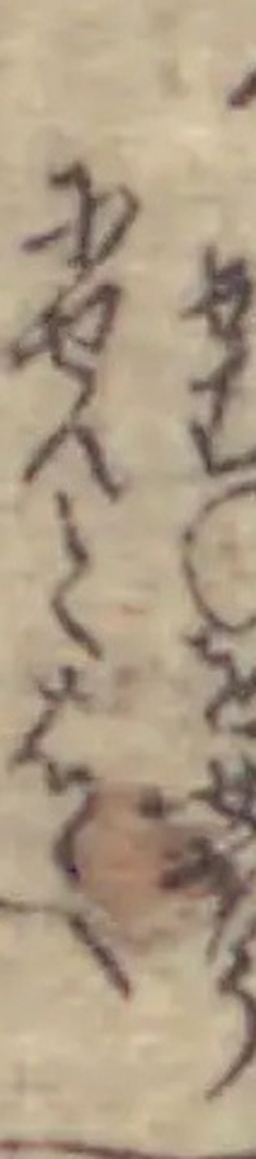にせんとはゝへ
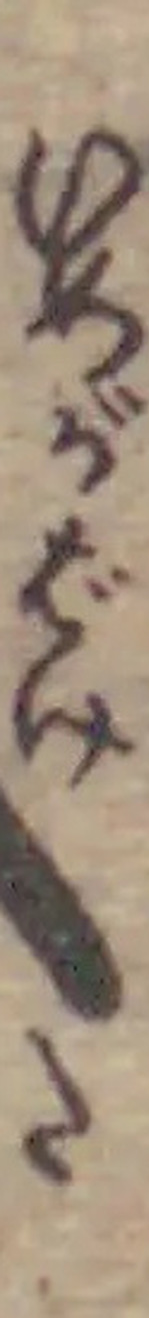ひめがばけた
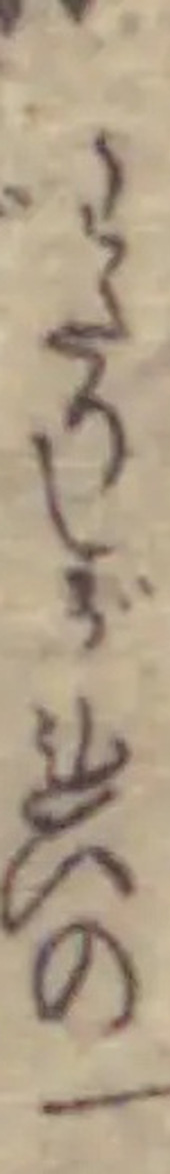わたりしがれいの
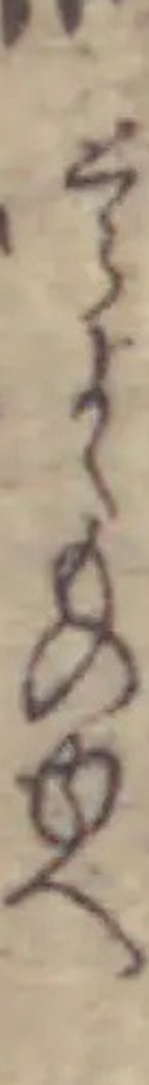どうよくものゆへ
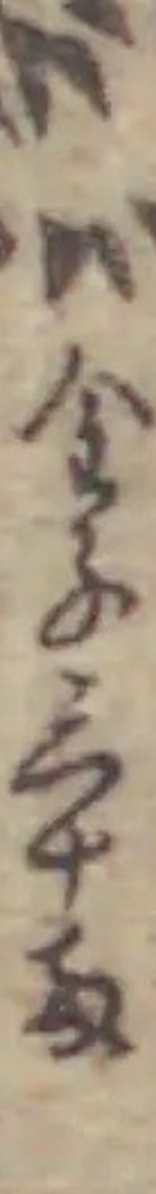金子三千両
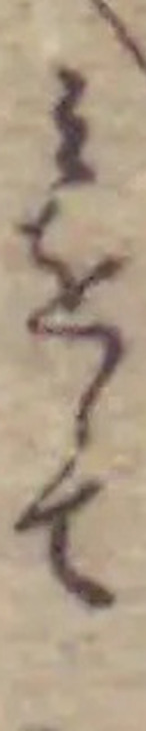みをして
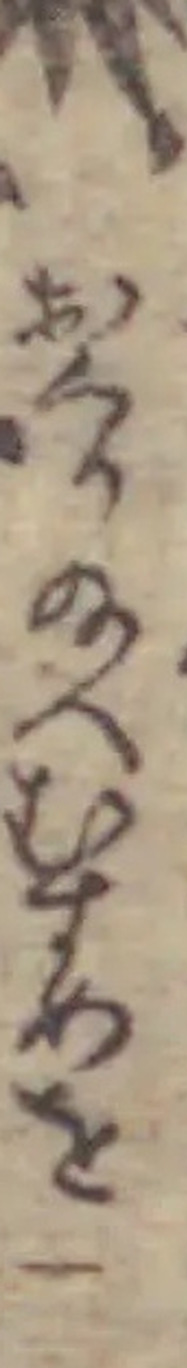おくり給へむすめを
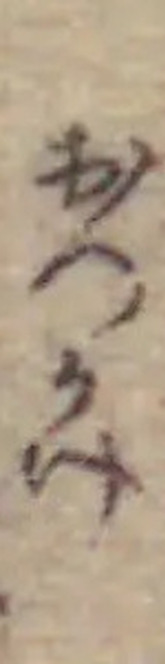おつかけ
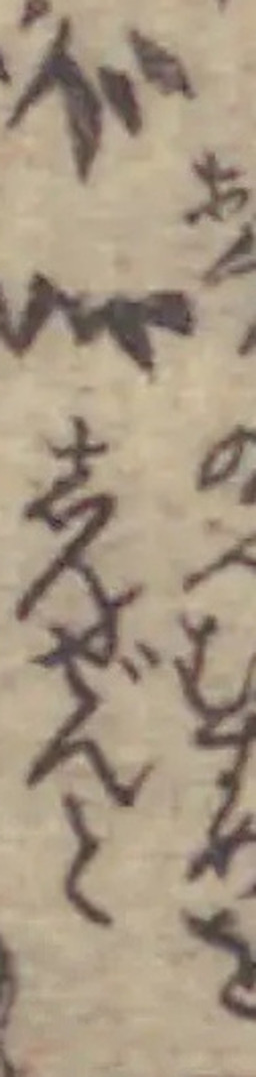しんぜんと
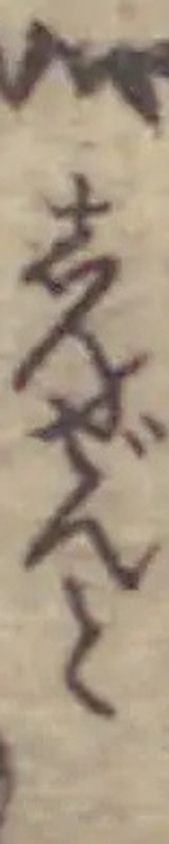しんぜんと
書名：奥州咄 3巻
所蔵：国立国会図書館 National Diet Library, JAPAN
